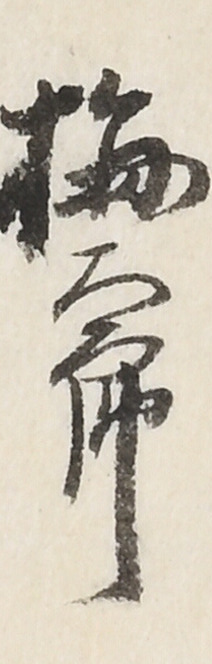梅太郎
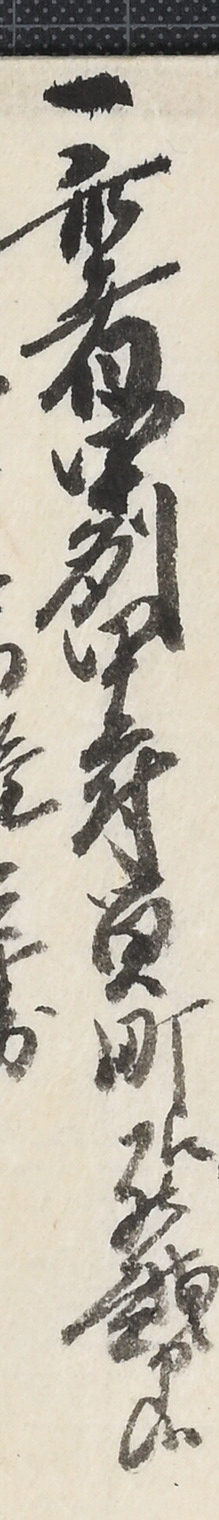一此者甲州甲府員町江罷越申候
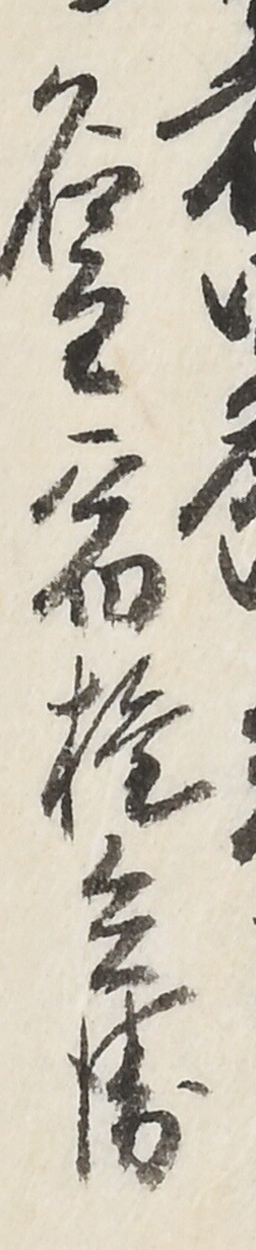名主宿権兵衛
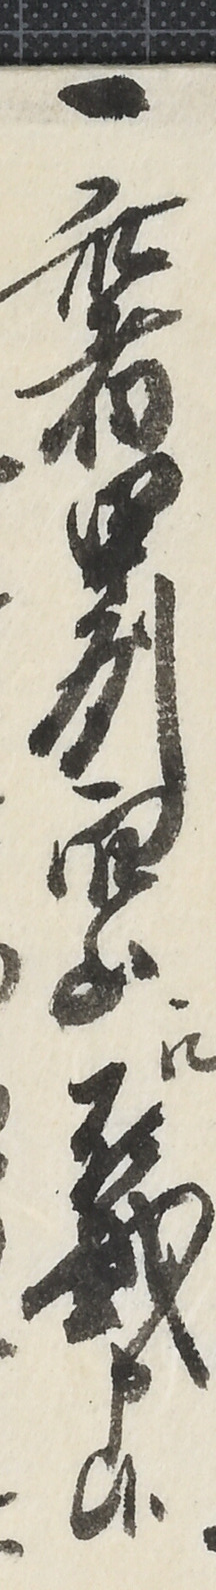一此者甲州穴山江罷越申候
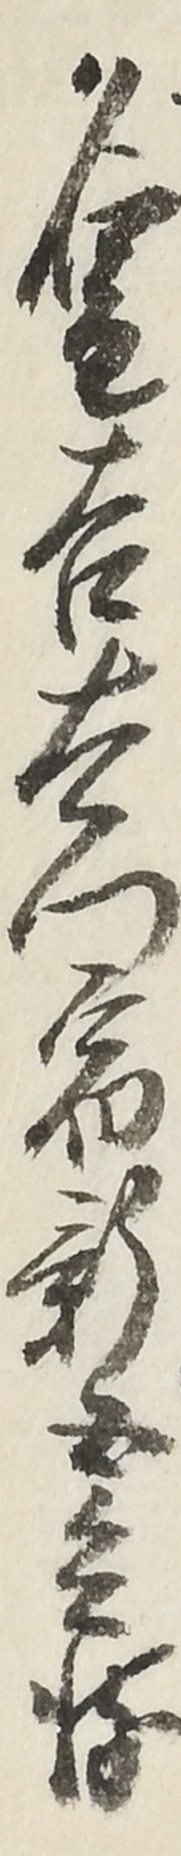名主吉左衛門宿新五兵衛
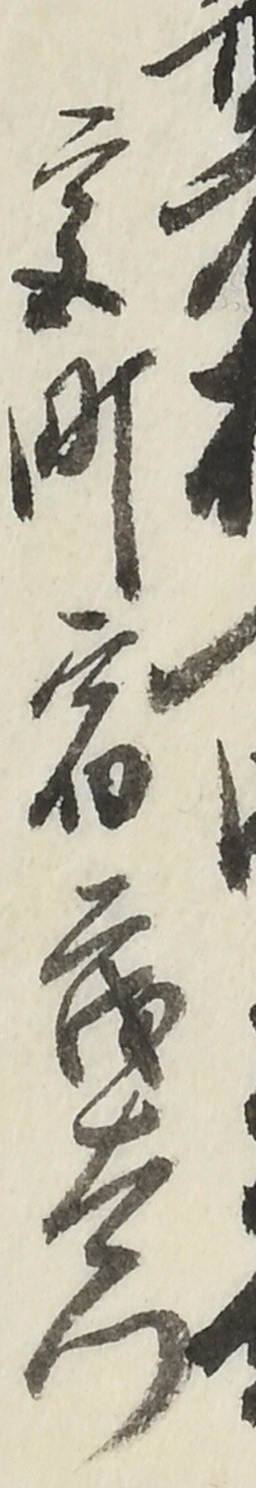宮町宿茂左衛門

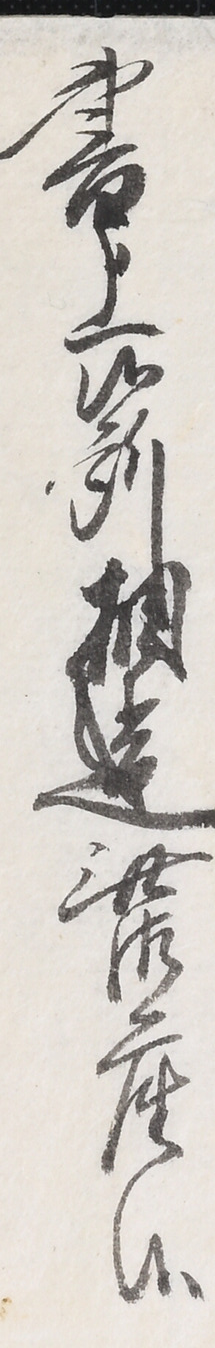書上候所相違無御座候
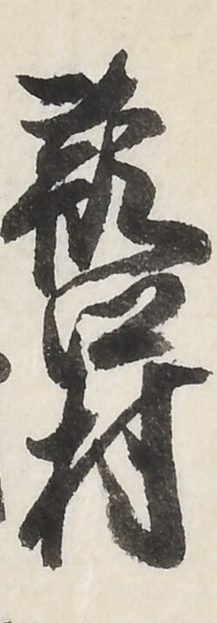荊口村
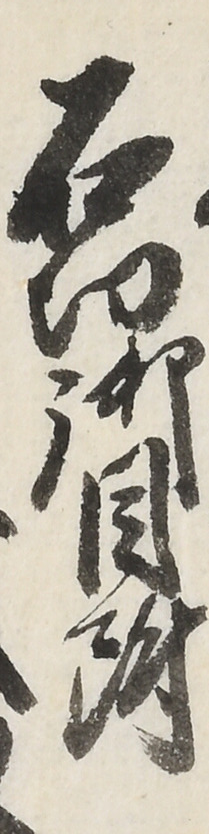石切御目附
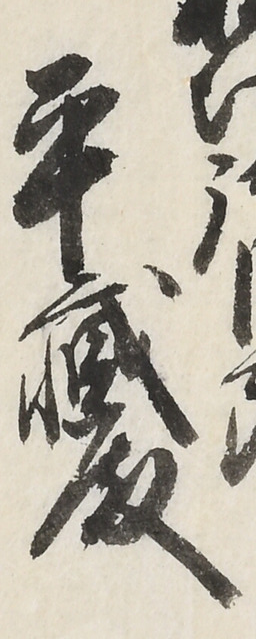平藏殿

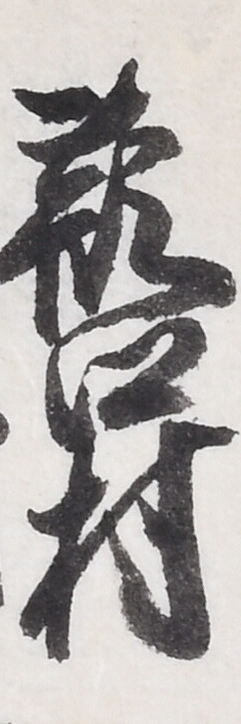荊口村
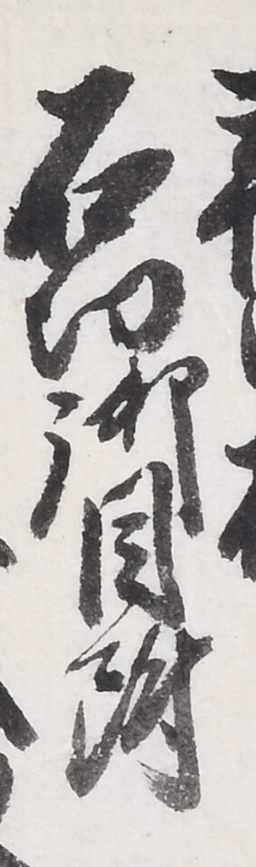石切御目附
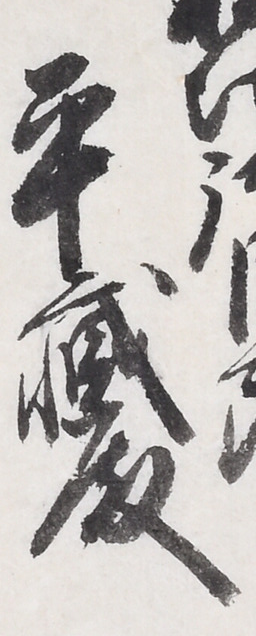平藏殿
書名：安政六己未年正月他國出石切名前書上帳
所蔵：伊那市立高遠町図書館・合同会社AMANE
